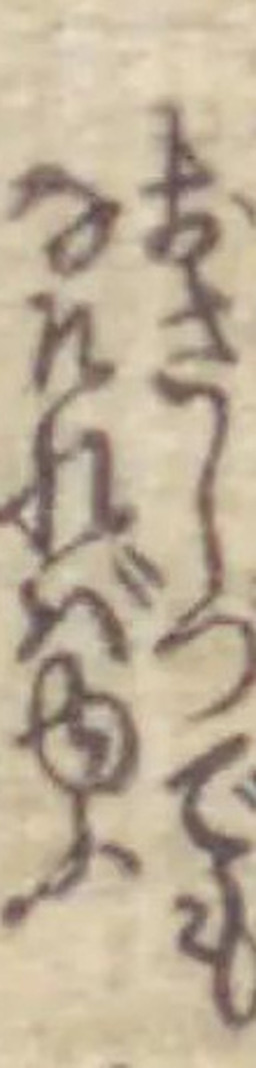なければゆふ
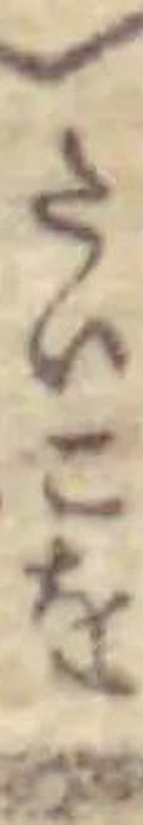たいこを
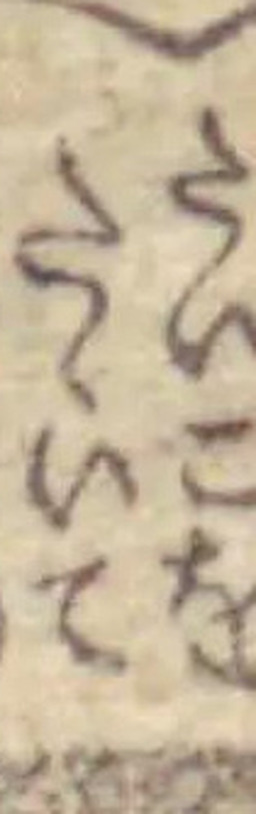たゝいて
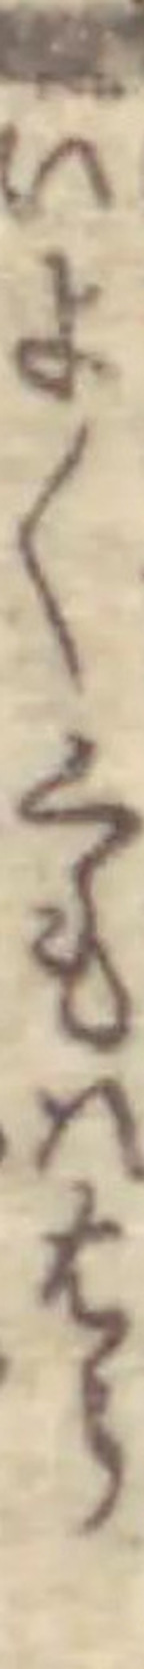いよ〳〵くもははら
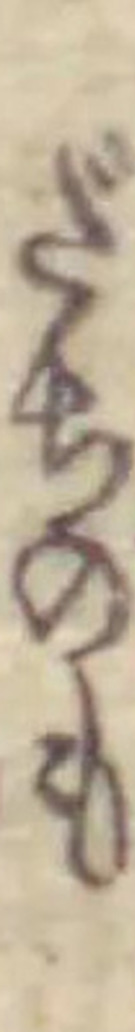だちのも
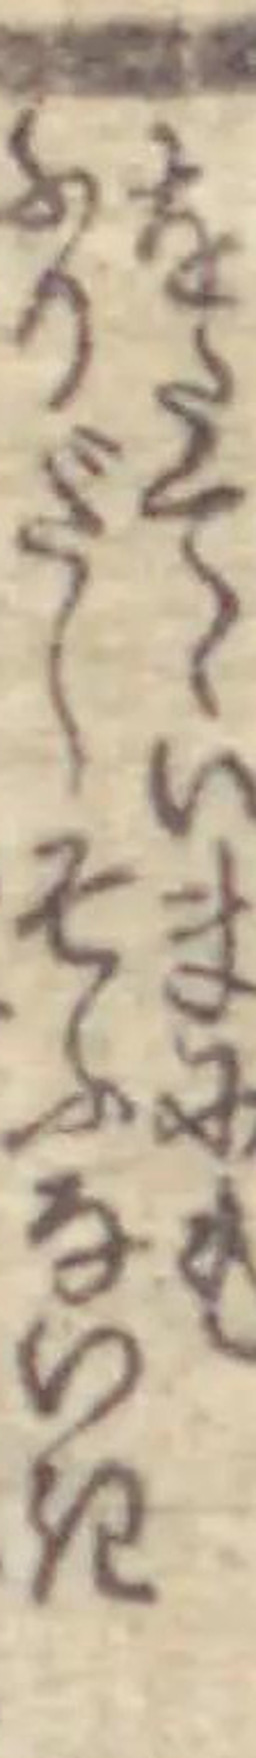ふりだしそふないき
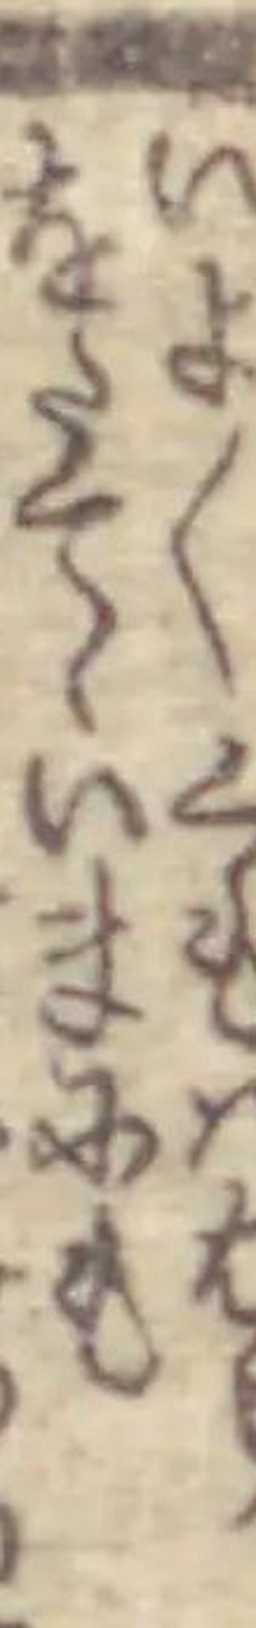をたてゝいまにも
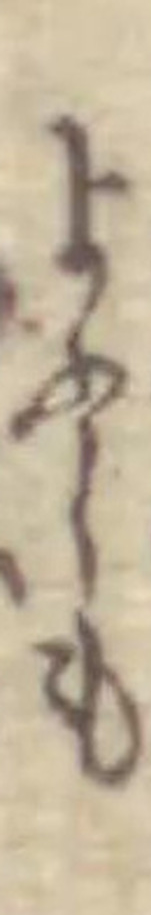よふしも
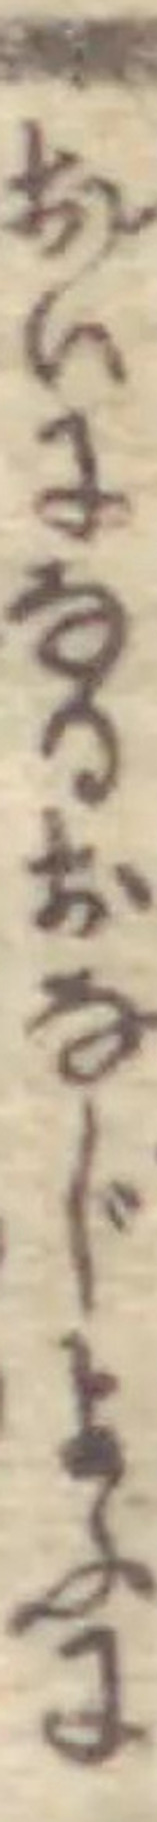おいになるおなじよふに
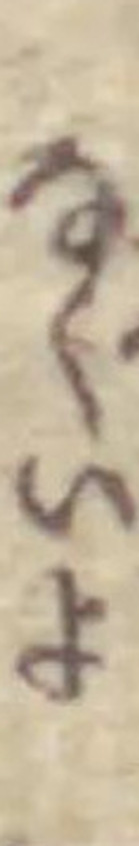なくいよ
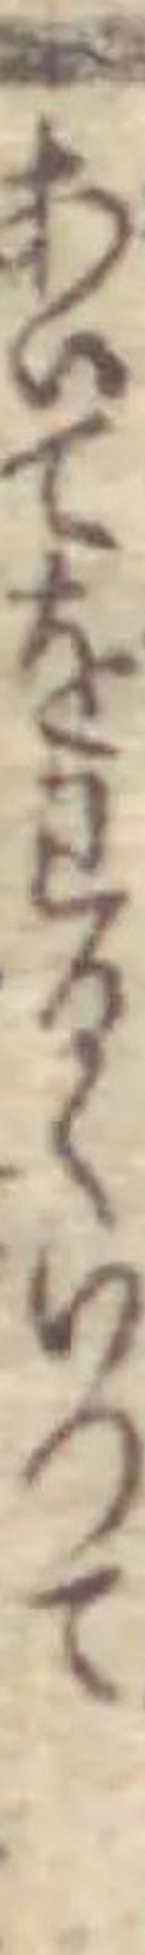あいてをわるくいつて
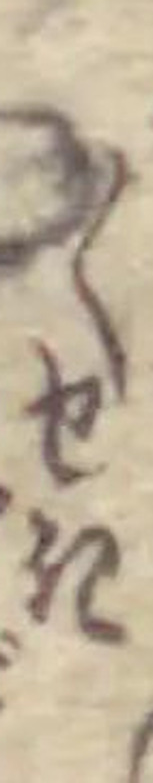〳〵せき
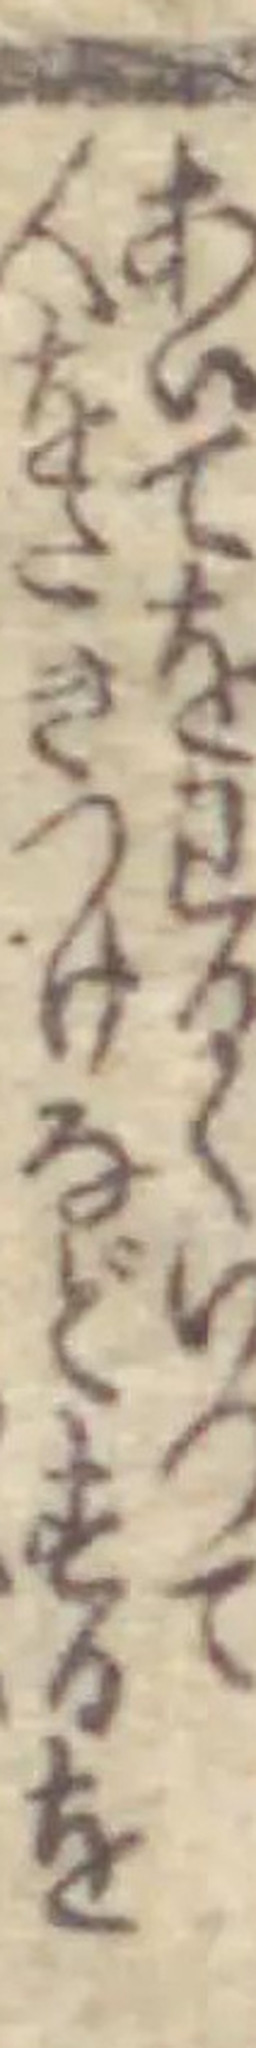人をたきつけなどするを
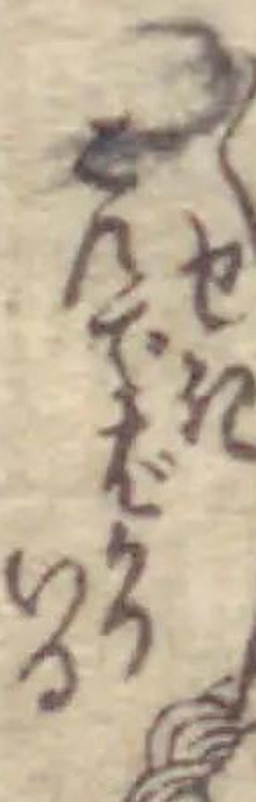こんでばかり
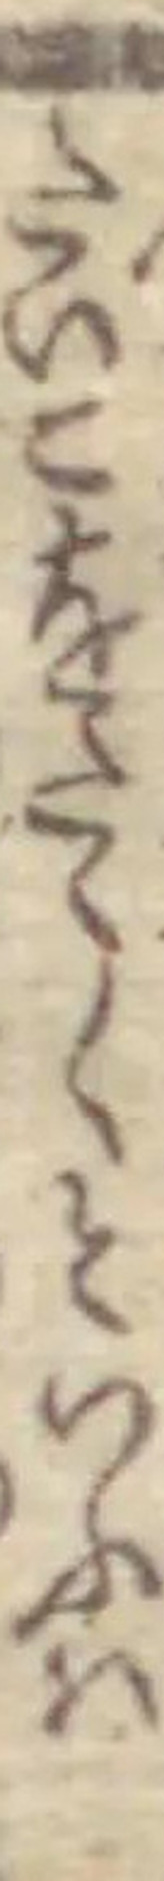たいこをたゝくといふは
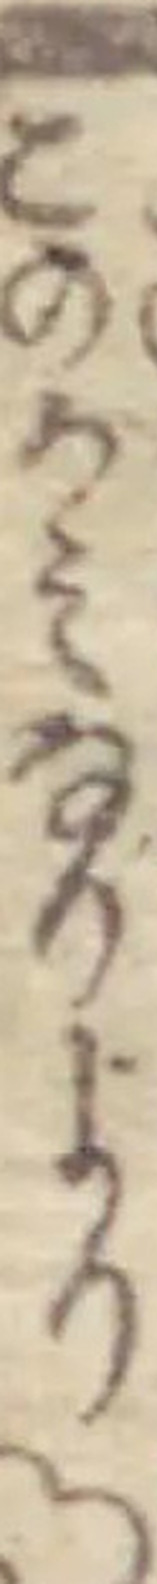このかみなりより
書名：雨宮風宮出儘略縁記 3巻
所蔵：国立国会図書館 National Diet Library, JAPAN
